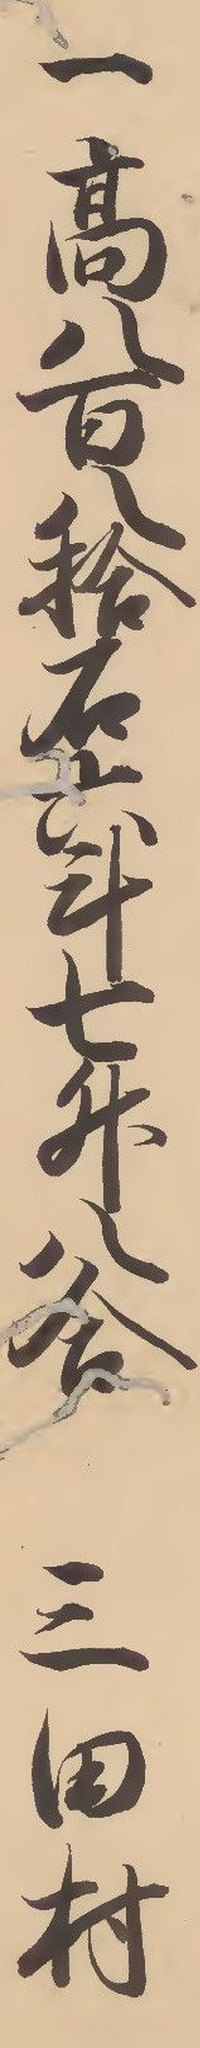一高八百八拾石六斗七升八合三田村

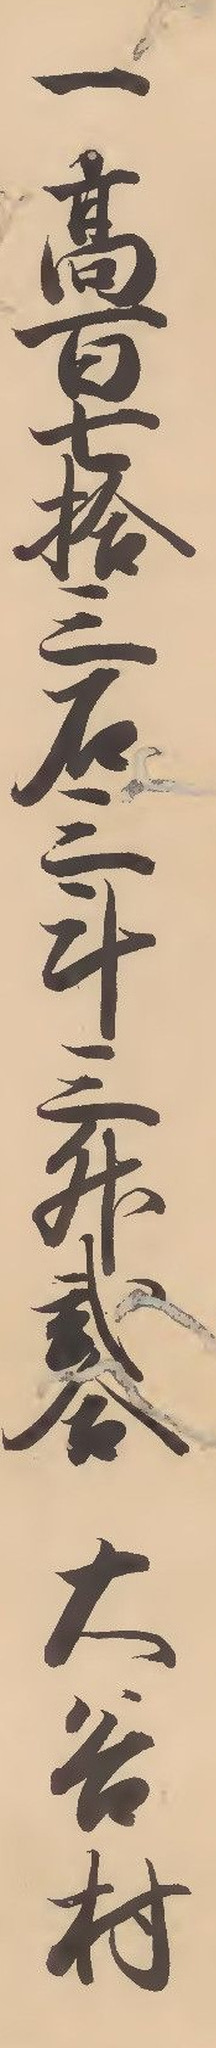一高百七拾三石三斗三升弐合大谷村
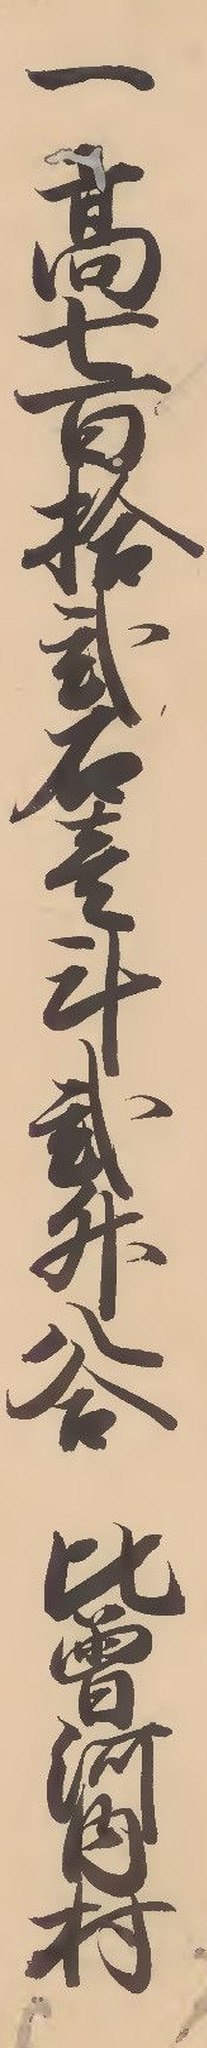一高七百拾弐石壱斗弐升八合比曽河内村
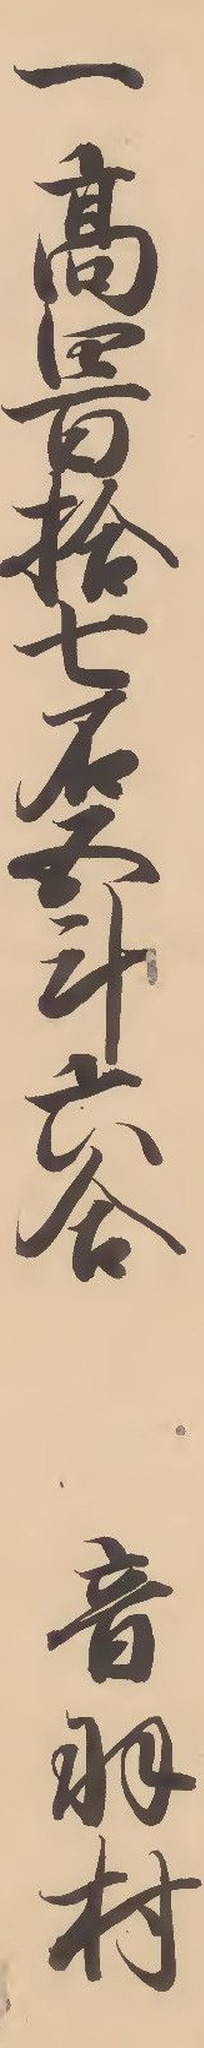一高四百拾七石五斗六合音羽村
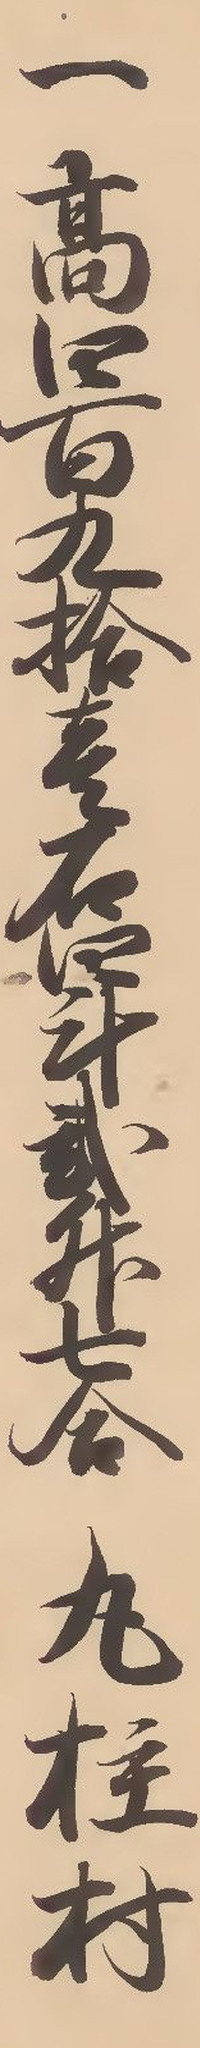一高四百九拾壱石四斗弐升七合丸柱村
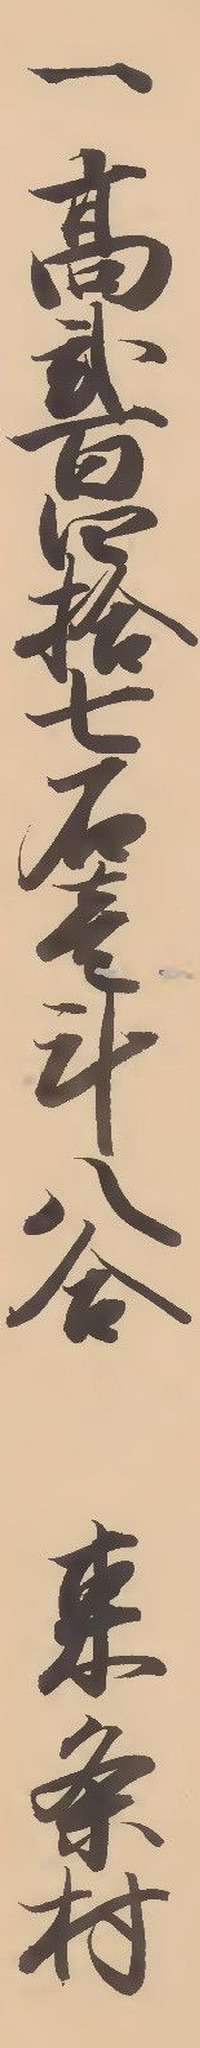一高弐百四拾七石壱斗八合東条村
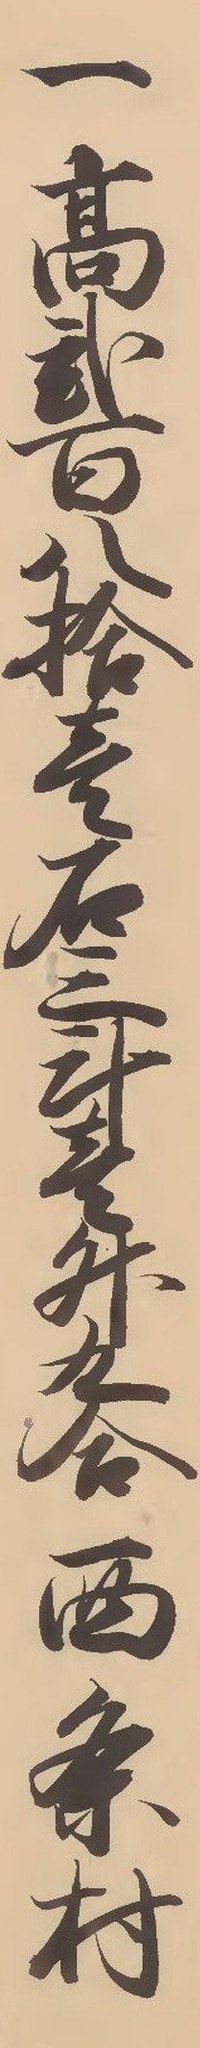一高弐百八拾壱石三斗壱升九合西条村
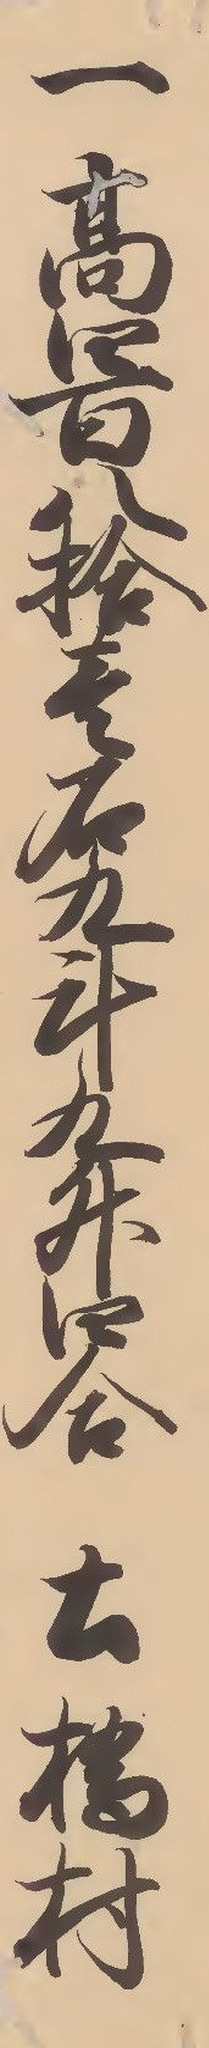一高四百八拾壱石九斗九升四合土橋村
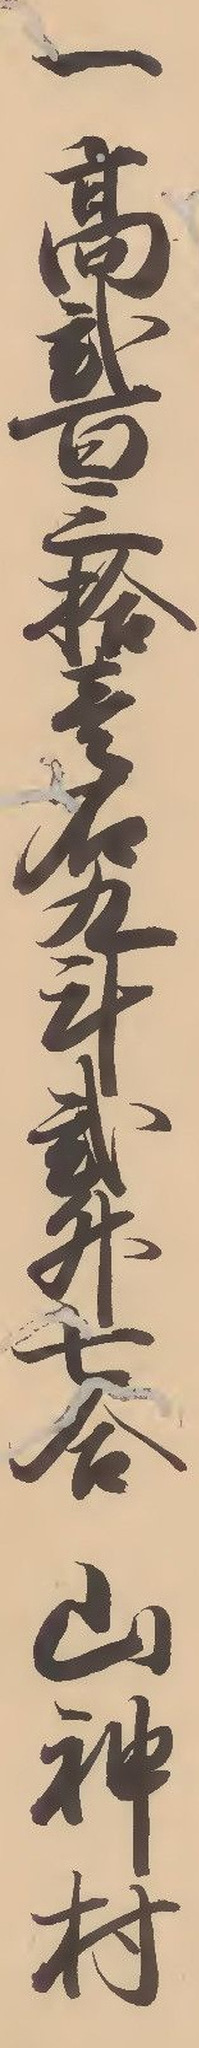一高弐百三拾壱石九斗弐升七合山神村

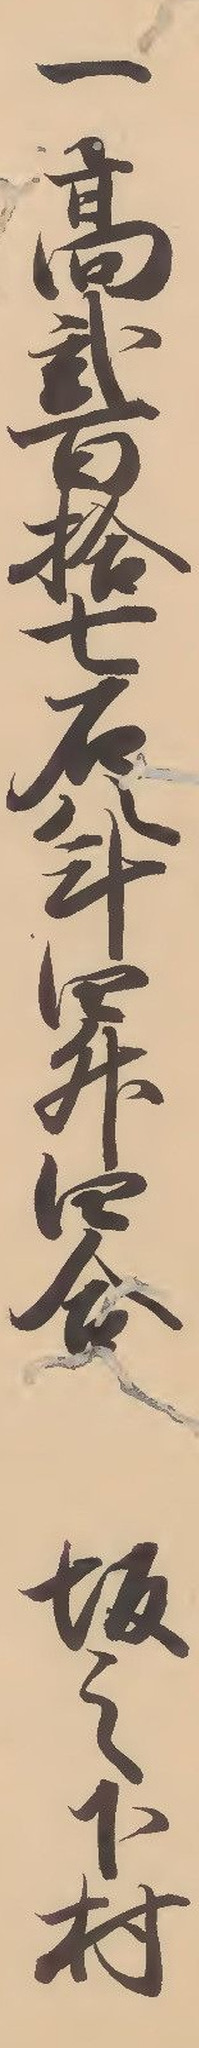一高弐百拾七石八斗四升四合坂之下村
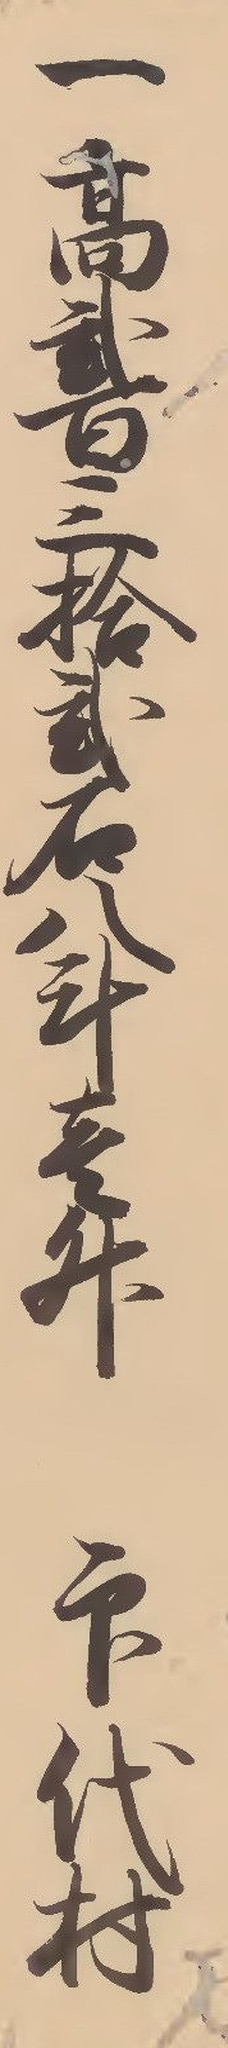一高弐百三拾弐石八斗壱升印代村
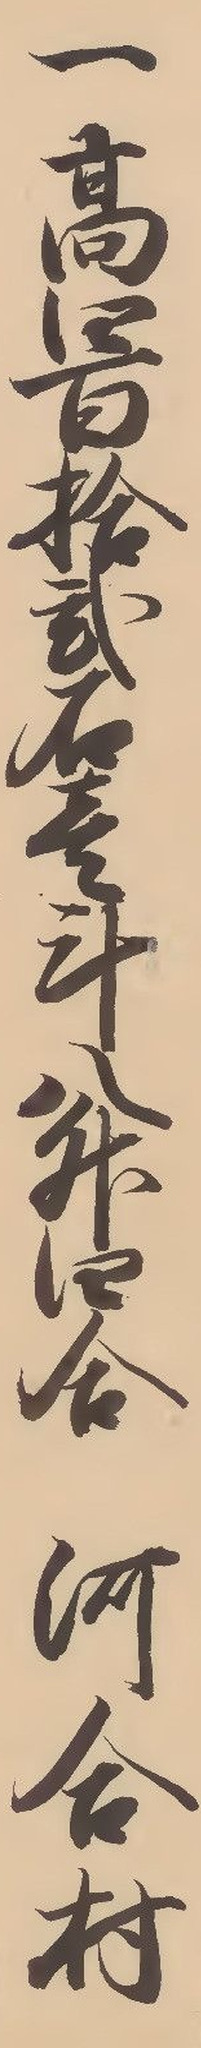一高四百拾弐石壱斗八升四合河合村
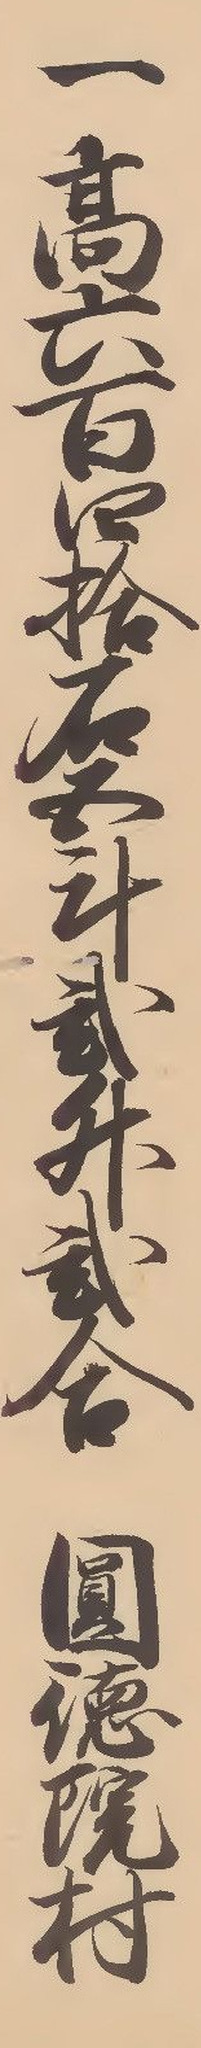一高六百四拾石五斗弐升弐合円徳院村
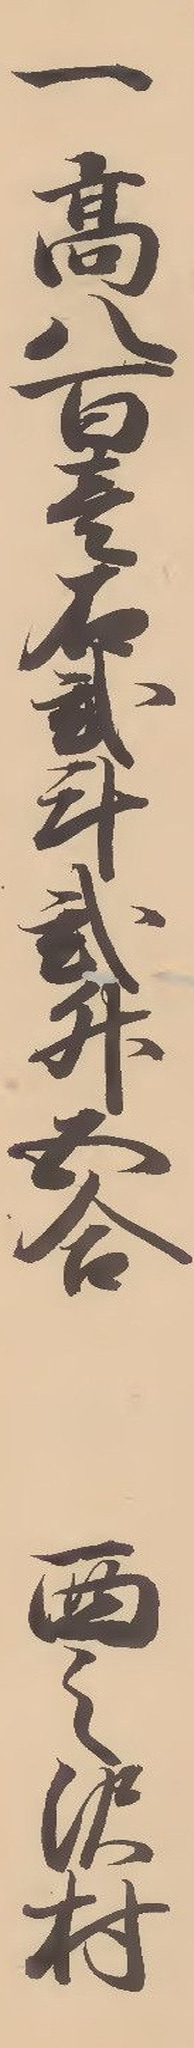一高八百壱石弐斗弐升五合西之沢村
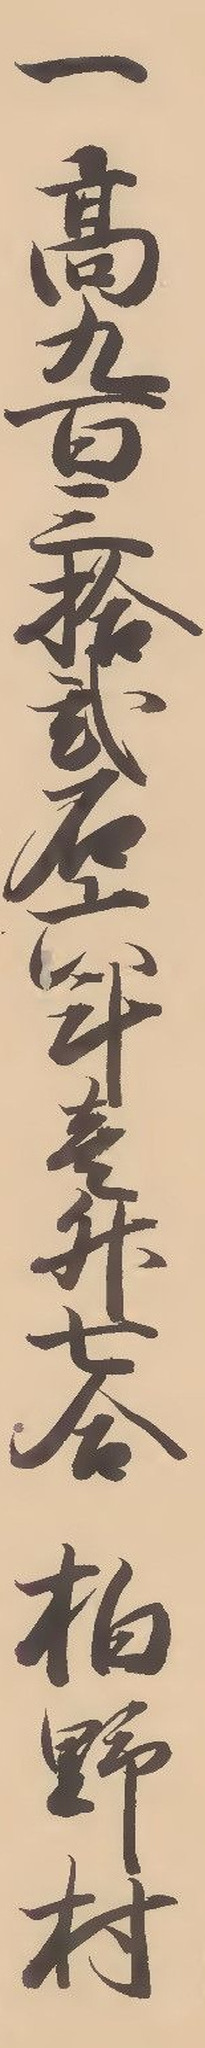一高九百三拾弐石六斗壱升七合柏野村
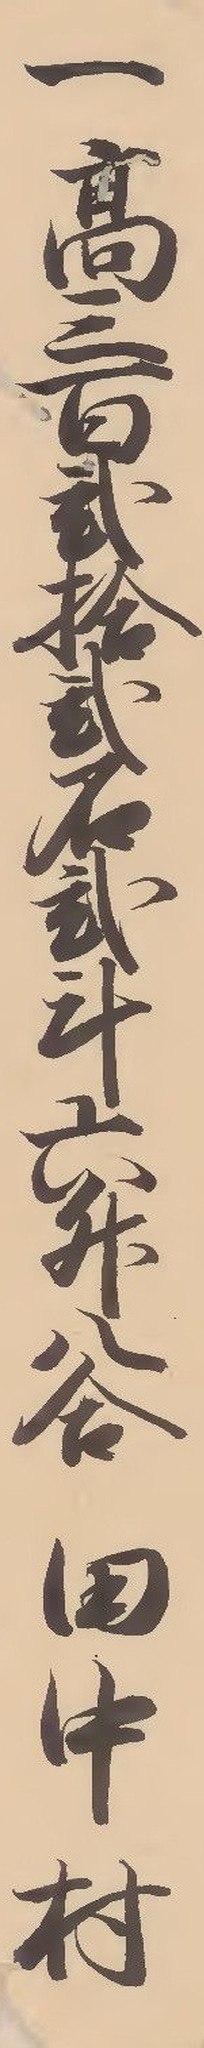一高三百弐拾弐石弐斗六升八合田中村
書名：伊賀国郷帳
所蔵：国立公文書館 National Archives of Japan
